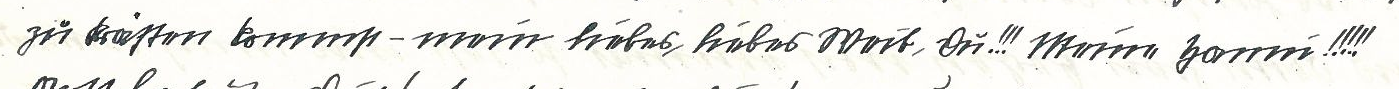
zu Kräften kommst – mein liebes, liebes Weib, Du!!! Meine Hilde!!!!!
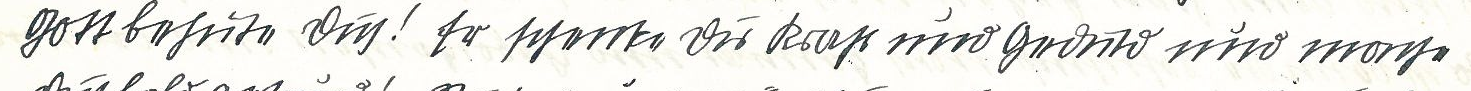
Gott behüte Dich! Er schenke Dir Kraft und Geduld und mache
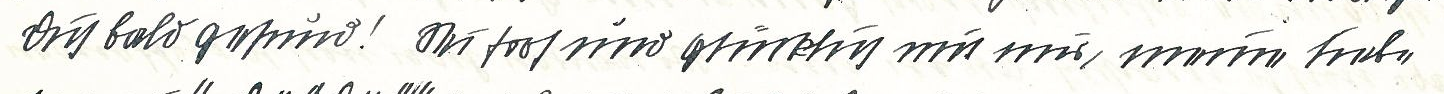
Dich bald gesund! So froh und glücklich mit mir, meine liebe
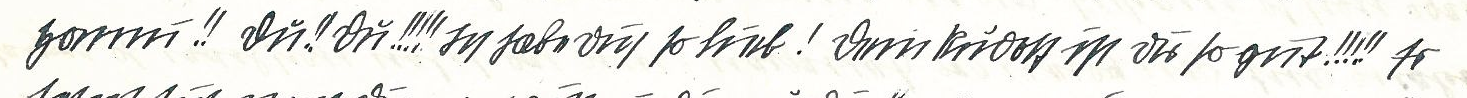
!! Du!! Du!!!!! Ich habe Dich so lieb! Dein Rudolf ist Dir so gut!!!! Er
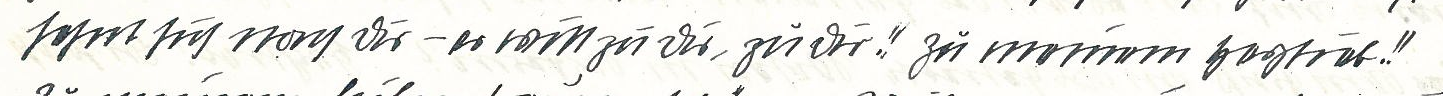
sehnt sich nach Dir – er will zu Dir, zu Dir!! Zu meinem Herzlieb!!
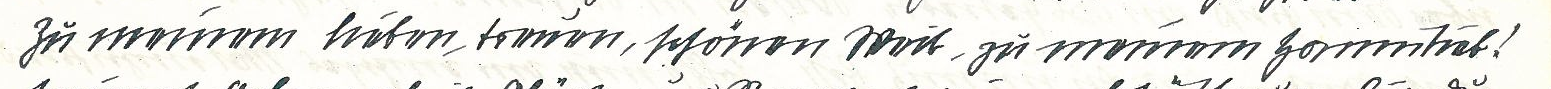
zu meinem lieben, treuen, schönen Weib, zu meinem lieb!
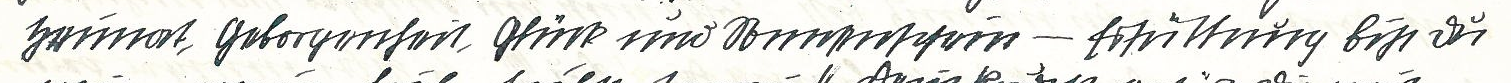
Heimat, Geborgenheit Glück und Sonnenschein – Erfüllung bist Du
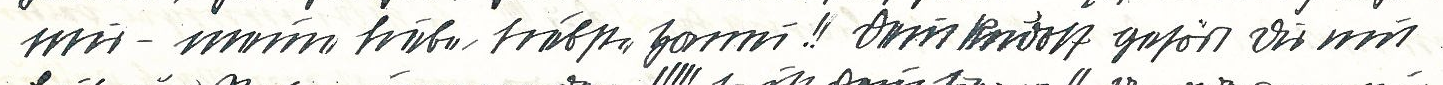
mir – meine liebe liebste!! Dein Rudolf gehört Dir mit
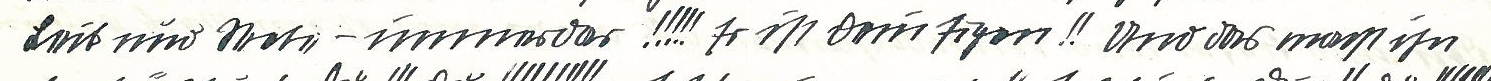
Leib und Seele – immerdar!!!!! Er ist Dein Eigen!! Und das macht ihn
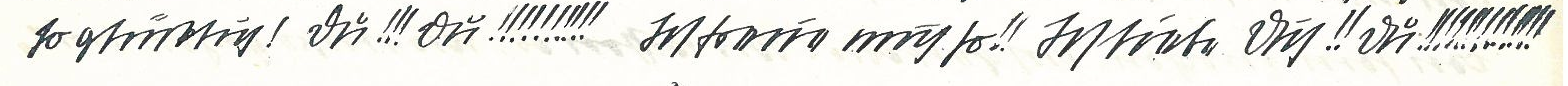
so glücklich! Du!! Du!!!!!!!!!! Ich freue mich so!! Ich liebe Dich!! Du!!!!!!!!!!!!!
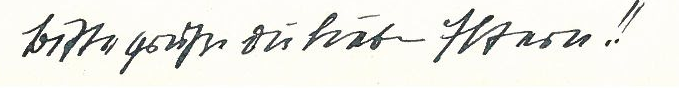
Bitte grüße die lieben Eltern!!
